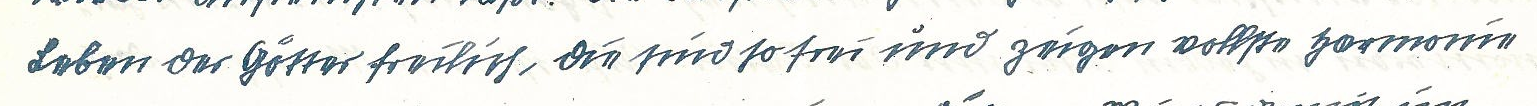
Leben der Götter freilich, die sind so frei und zeigen vollste Harmonie
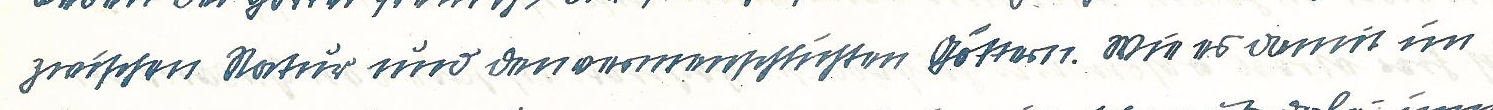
zwischen Natur und den vermenschlichten Göttern. Wie es damit im
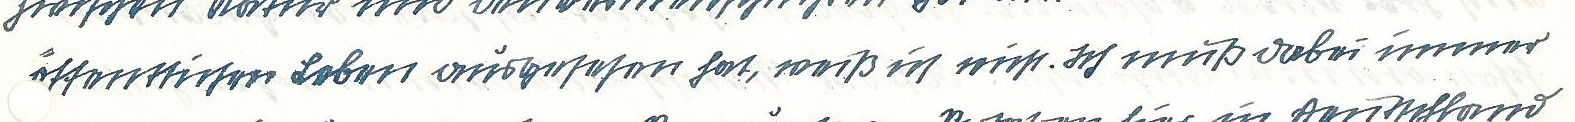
öffentlichen Leben ausgesehen hat, weiß ich nicht. Ich muß dabei immer
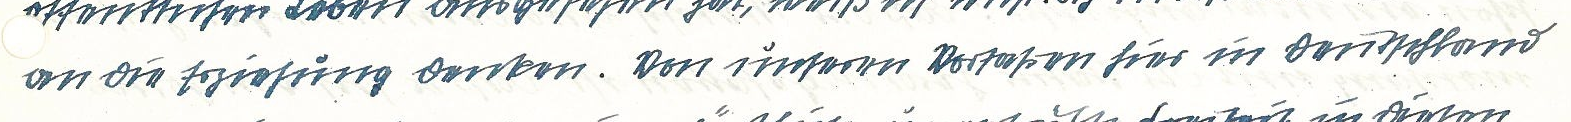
an die Erziehung denken. Von unseren Vorfahren hier in Deutschland
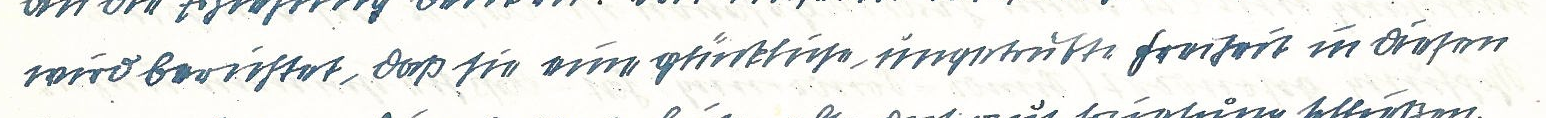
wird berichtet, daß sie eine glückliche, ungetrübte Freiheit in diesen
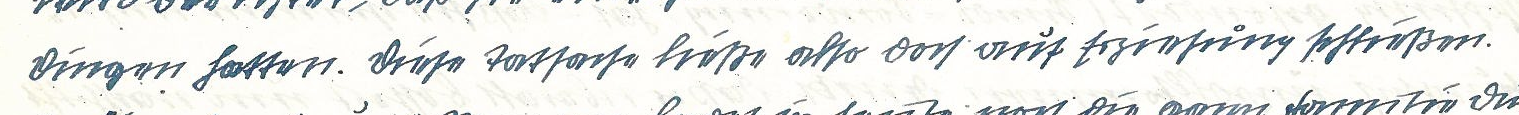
Dingen hatten. Diese Tatsache ließe also doch auf Erziehung schließen.
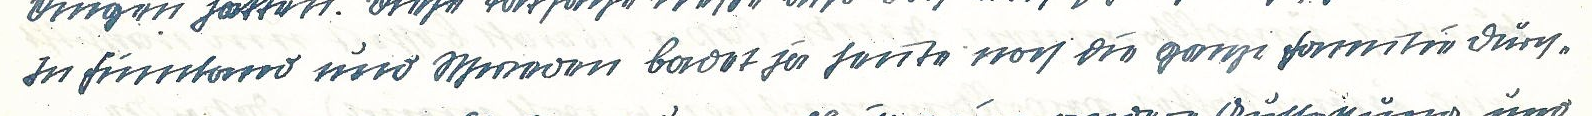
In Finnland und in Schweden badet ja heute noch die ganze Familie durch¬
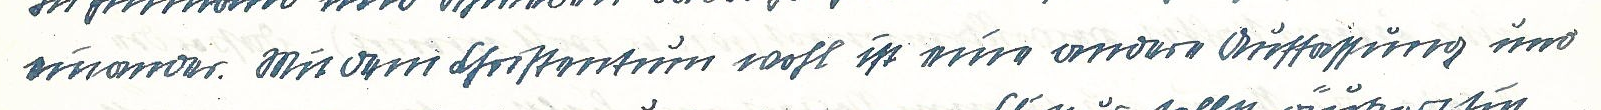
einander. Mit dem Christentum wohl ist eine andere Auffassung und
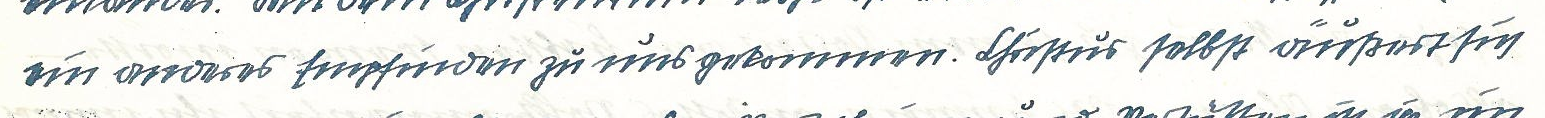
ein anderes Empfinden zu uns gekommen. Christus selbst äußert sich
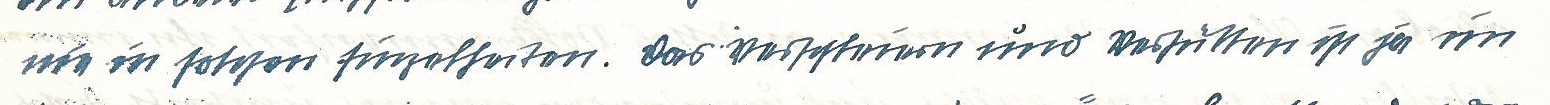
nie in solchen Einzelheiten. Das Verschleiern und Verhüllen ist ja im
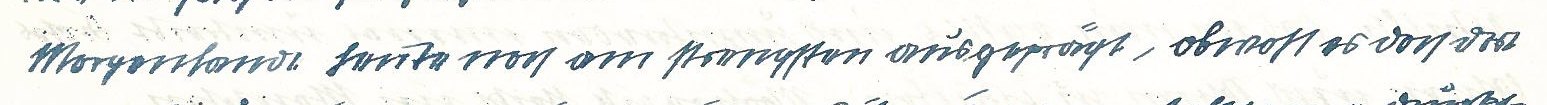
Morgenlande heute noch am strengsten ausgeprägt, obwohl es doch dort
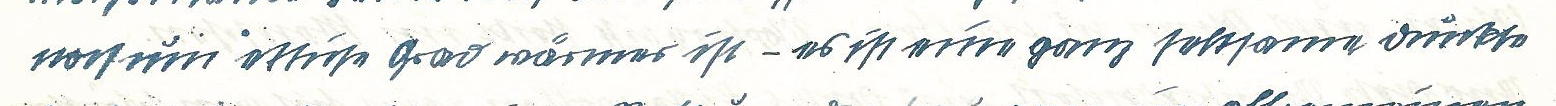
noch um etliche Grad wärmer ist – es ist eine ganz seltsame dunkle
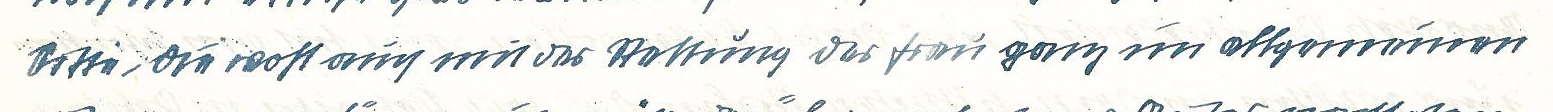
Sitte, die wohl auch mit der Stellung der Frau ganz im allgemeinen
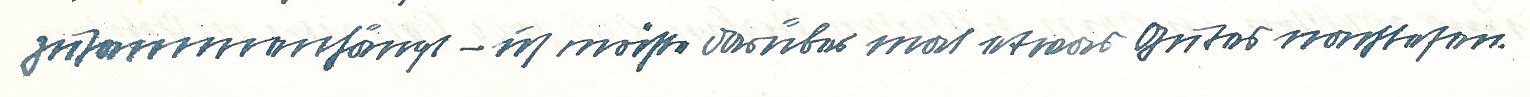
zusammenhängt – ich möchte darüber mal etwas Gutes nachlesen.
